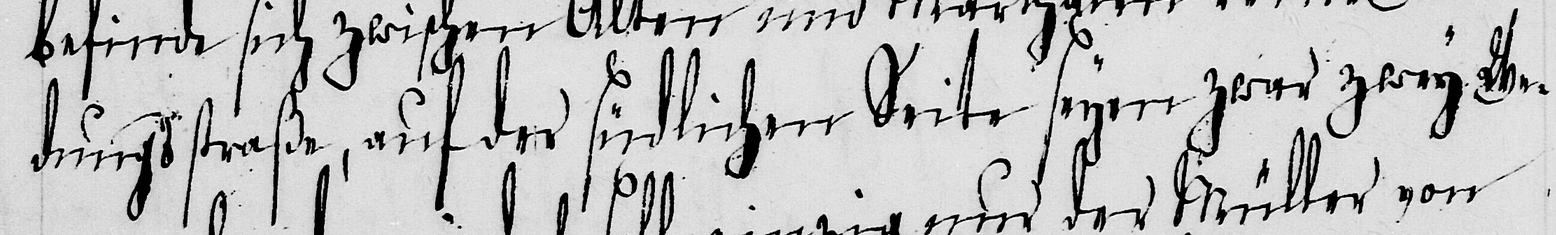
dungsstraße, auf der südlichen Seite seyen zwar zwey We¬
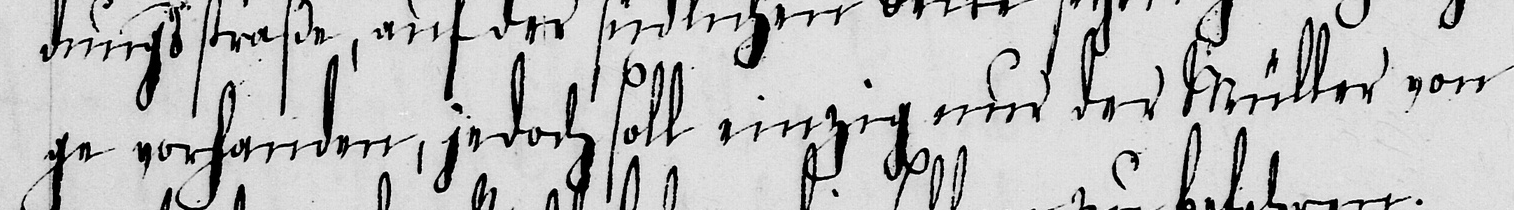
ge vorhanden, jedoch soll einzig nur der Müller von
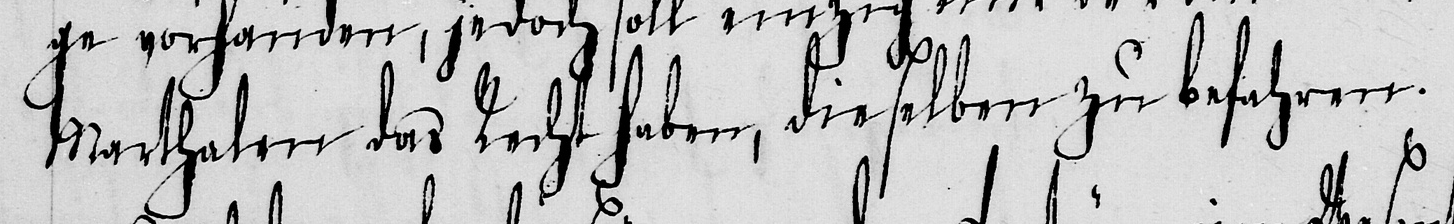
Marthalen das Recht haben, dieselben zu befahren.
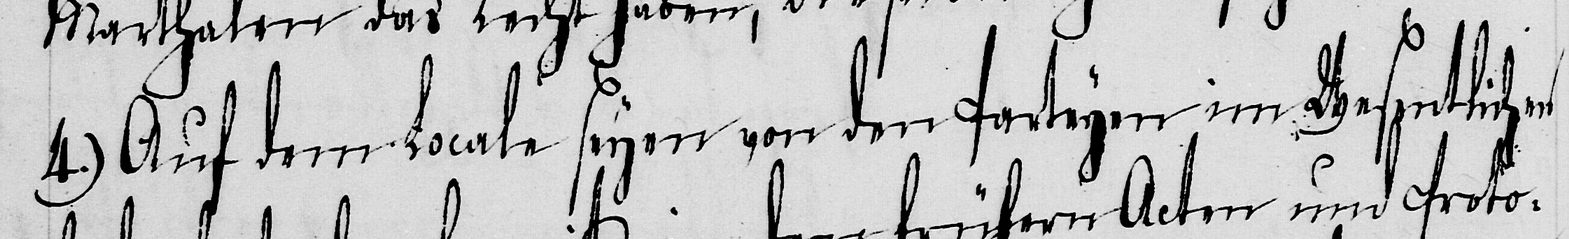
4.) Auf dem Locale seyen von den Parteyen im Wesentlichen
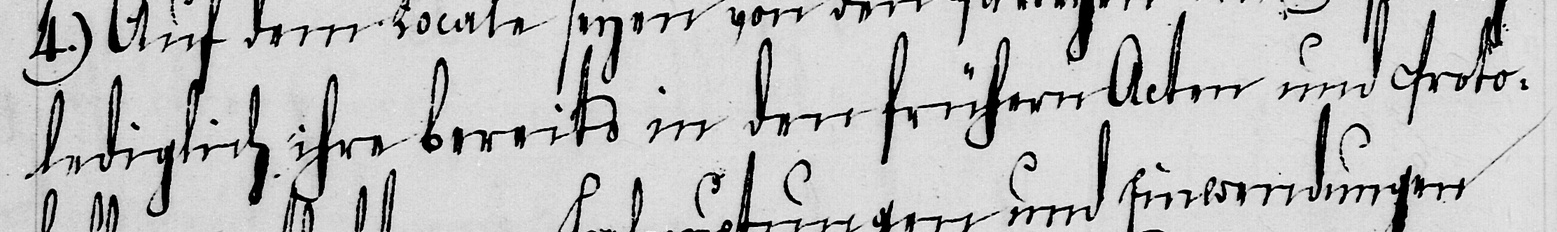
lediglich ihre bereits in den frühern Acten und Proto¬
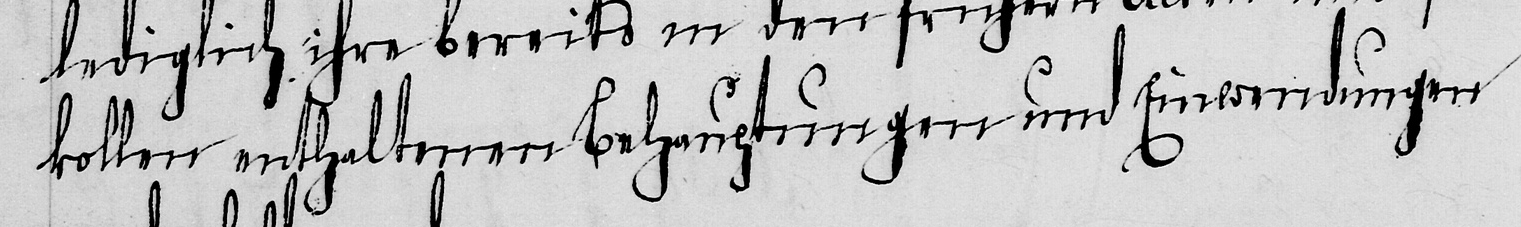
kollen enthaltenen Behauptungen und Einwendungen
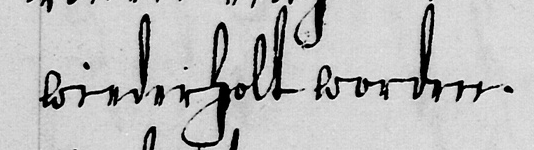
wiederholt worden.
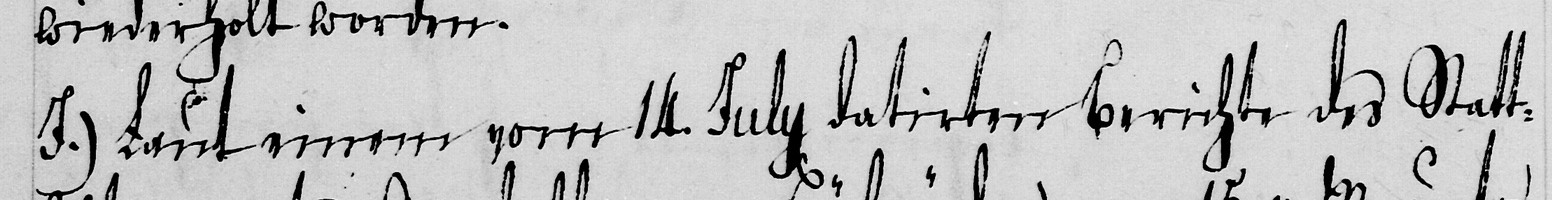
J.) Laut einem vom 14. July datirten Berichte des Stat¬
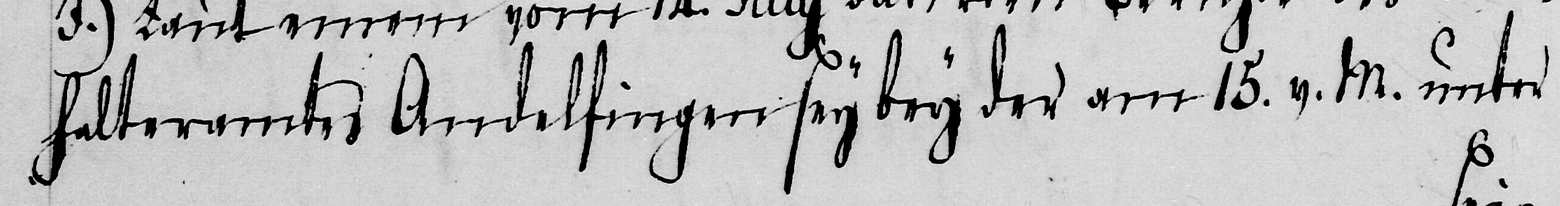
thalteramtes Andelfingen sey bey der am 15. v. M. unter
